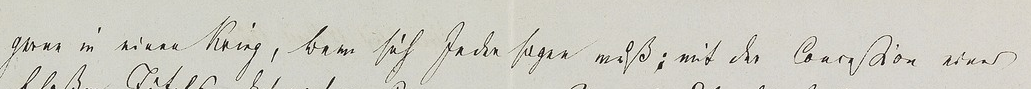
gerne in einen Krieg, wenn sich Jeder sagen muß; mit der Conceßion eines
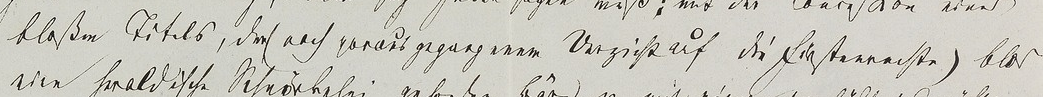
bloßen Titels, der (nach vorausgegangenem Verzicht auf die Fürstenrechte) blos
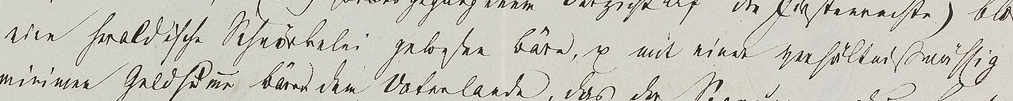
eine heraldische Schnörkelei gewesen wäre, & mit einer verhältnißmässig
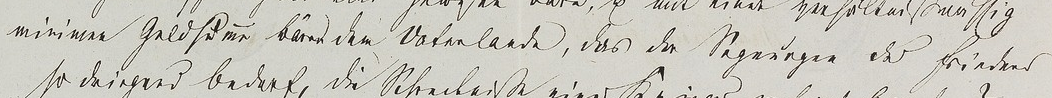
minimen Geldsumme wären dem Vaterlande, das der Segnungen des Friedens
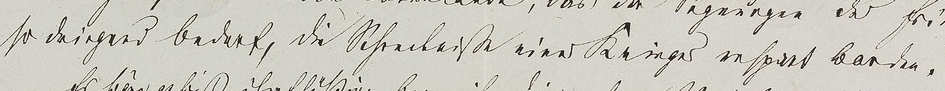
so dringend bedarf, die Schreckniße eines Krieges erspart worden? –
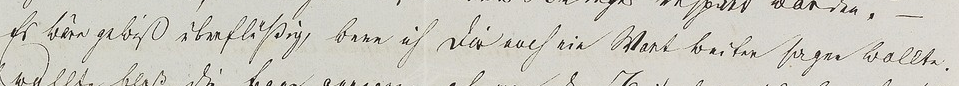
Es wäre gewiß überflüßig, wenn ich Dir noch ein Wort weiter sagen wollte.
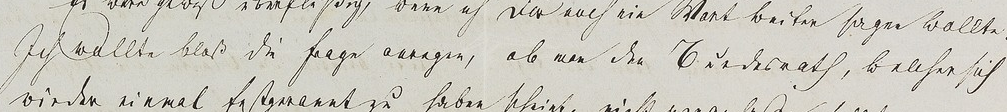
Ich wollte bloß die Frage anregen, ob man den Bundesrath, welcher sich
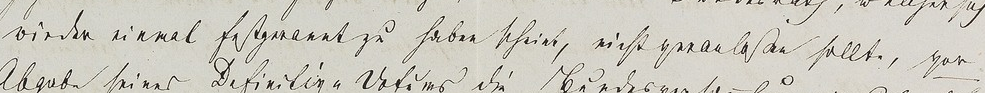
wieder einmal festgerannt zu haben scheint, nicht veranlaßen sollte, vor
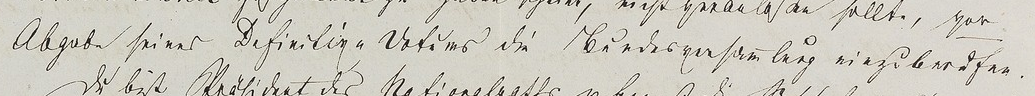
Abgabe seines Definitiv-Votums die Bundesversammlung einzuberufen.
